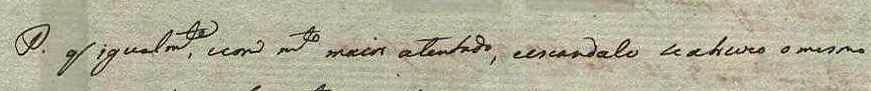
P. q̄ igualm.te e com m.to maior atentado, e escandalo se atreveo o mesmo
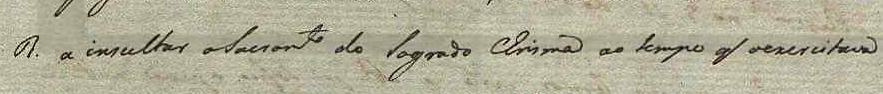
R. a insultar o Sacram.to do Sagrado Chrisma ao tempo q̄ o exercitava
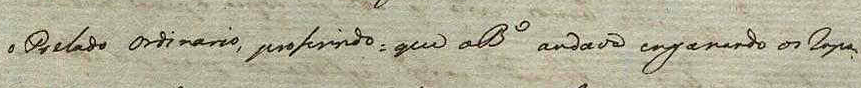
o Prelado ordinario, proferindo: que o B.o andava enganando os Rapa
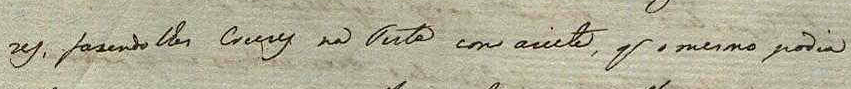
zes fazendolhes Cruzes na Testa com azeite, q̄ o mesmo podia
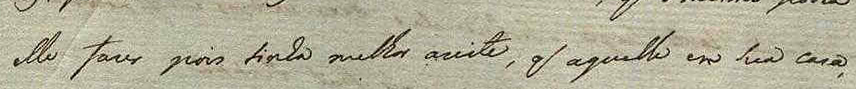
elle fazer pois tinha melhor azeite, q̄ aquelle em sua casa,
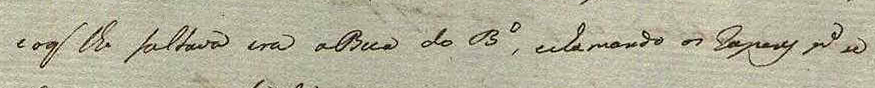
e o q̄ lhe faltava era a Beca do B.o, e chamando os Rapazes p.a se
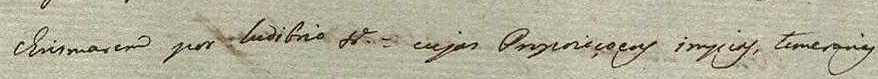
chrismarem por ludibrio &r.a = cujas Propoziçoens impias, temerarias
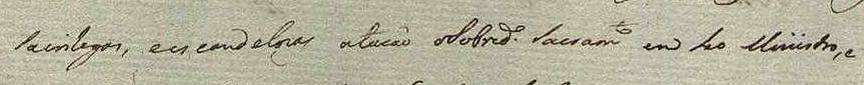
sacrilegas, e escandelozas atacaõ o Sobred.o Sacram.to em seo Ministro, e
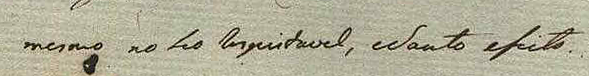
mesmo no seo Respeitavel, e Santo efeito.
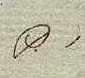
P.
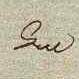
Que
